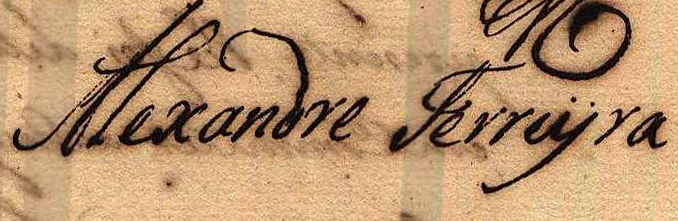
Alexandre Ferreyra
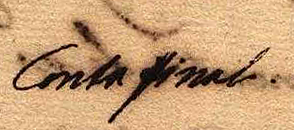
Conta final.
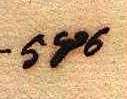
586
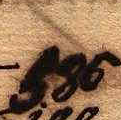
586
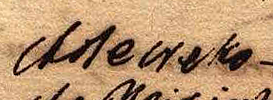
ao secreto.
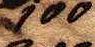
100
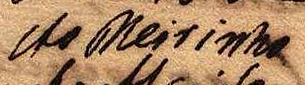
Ao Meirinho
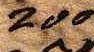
200
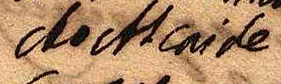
Ao Alcaide
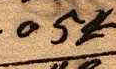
054
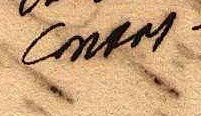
contas
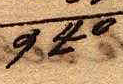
950
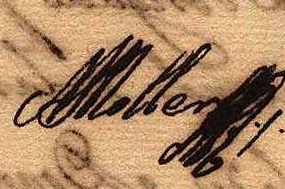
Moller
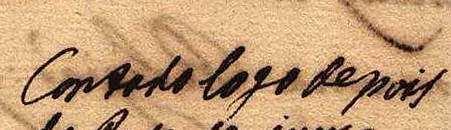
Contado logo depois
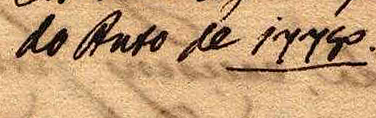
do Auto de i778.
